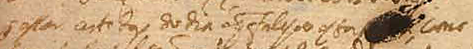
passar certidaꝭ do dia ē q̄ faleseo esta _, como
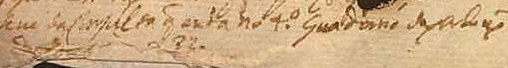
teue da Consulta q̄ esta no 4.o Quaderno das ordens̄
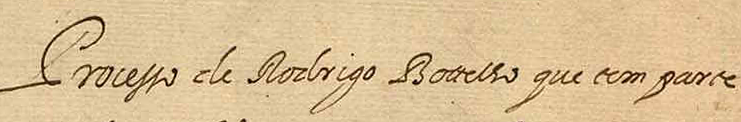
Processo de Rodrigo Bottelho que tem parte
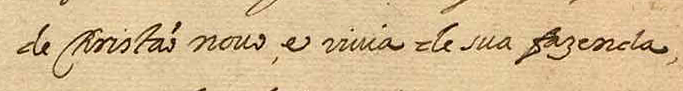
de Christaõ nouo, e viuia de sua fazenda,
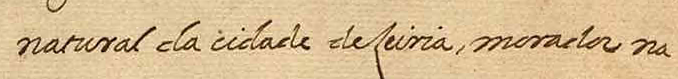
natural da cidade de Leiria, morador na
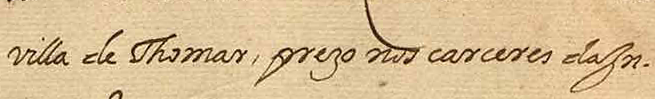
villa de Thomar, prezo nos carceres da Jn
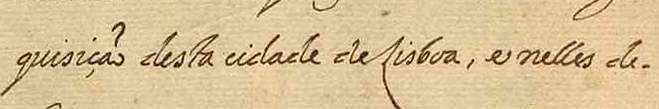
quisição desta cidade de Lisboa, e nelles de
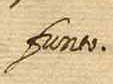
funto.
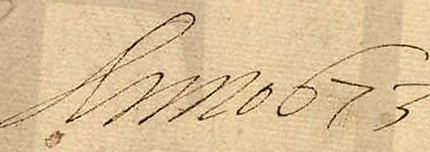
Anno 673
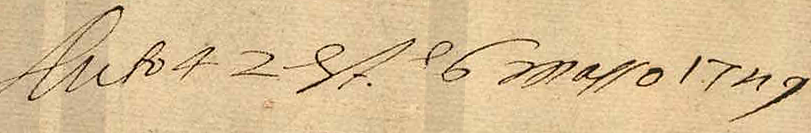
Auto 42 est.e 6 masso 1749
